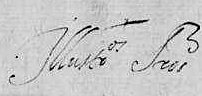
Illustr.os S̄res
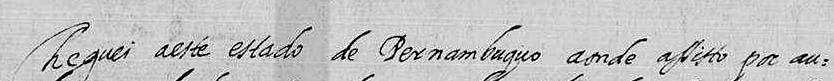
Cheguei a este estado de Pernambuquo aonde assisto por au
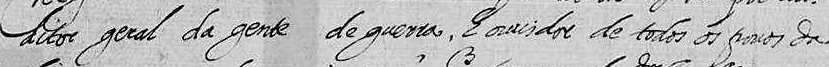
ditor geral da gente de guerra, E ouuidor de todos os pouos da
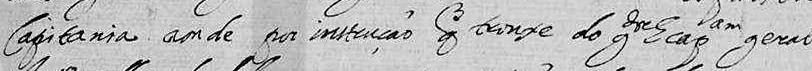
Capitania aonde por instruçaõ q̄ trouxe do gdor E capam geral
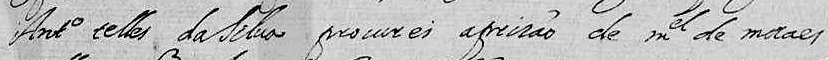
Anto telles da Silua procurei a prizão de mel de moraes
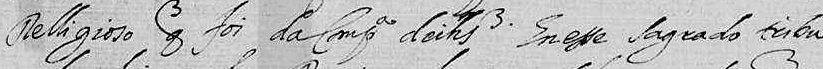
Relligioso q̄ foi da Compa de ihs̄ E nesse sagrado tribu
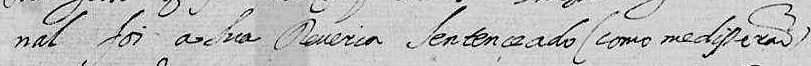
nal foi a Sua Reueria Sentenceado (como me disserão)
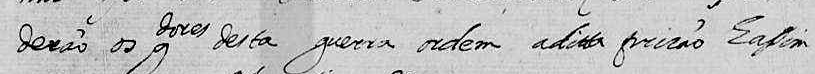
derão os gdores desta guerra ordem a ditta prizaõ E assim
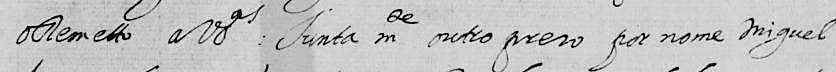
o Remetto a V sas. Juntamte outro preso por nome miguel
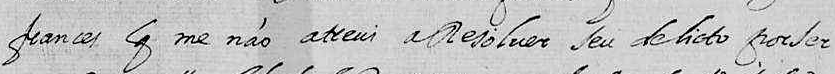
frances q̄ me não atreui a Resoluer seu delicto por ser
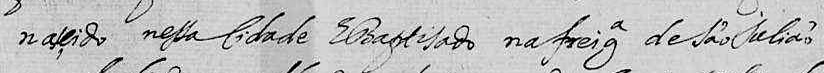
nascido nessa Cidade E Baptisado na freiga de saõ Juliaõ
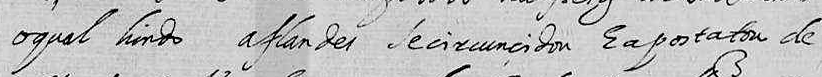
o qual hindo a flandes se circuncidou E apostatou de
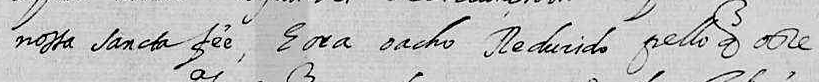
nossa sancta fée, E ora o acho Reduzido pello q̄ o Re
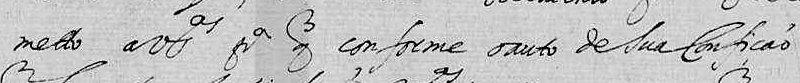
metto a V sas pa q̄ conforme o auto de Sua Confiçaõ
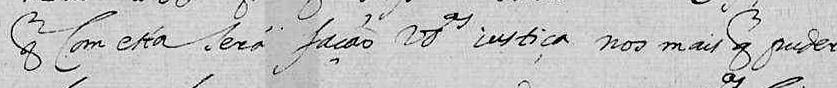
q̄ Com esta será fação V sas iustiça nos mais q̄ puder
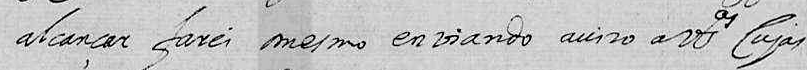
alcançar farei o mesmo enviando auizo a V sas Cujas
